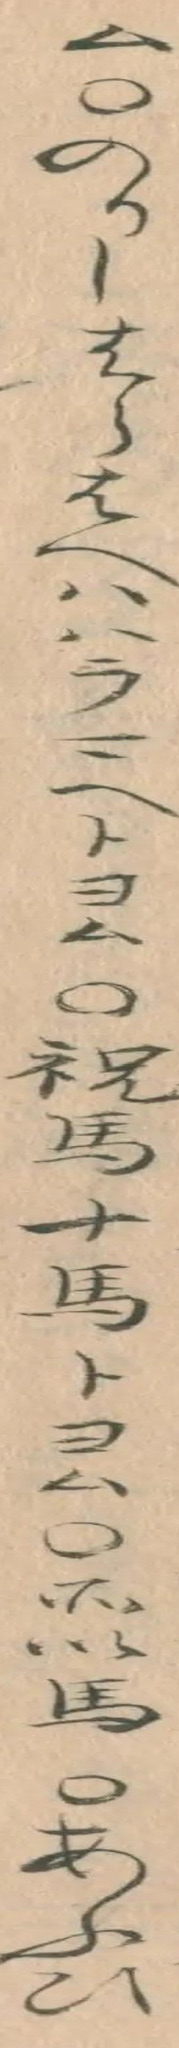ム〇のりしはらはへハハラマへトヨム〇祝馬十馬トヨム〇所以馬〇あふひ
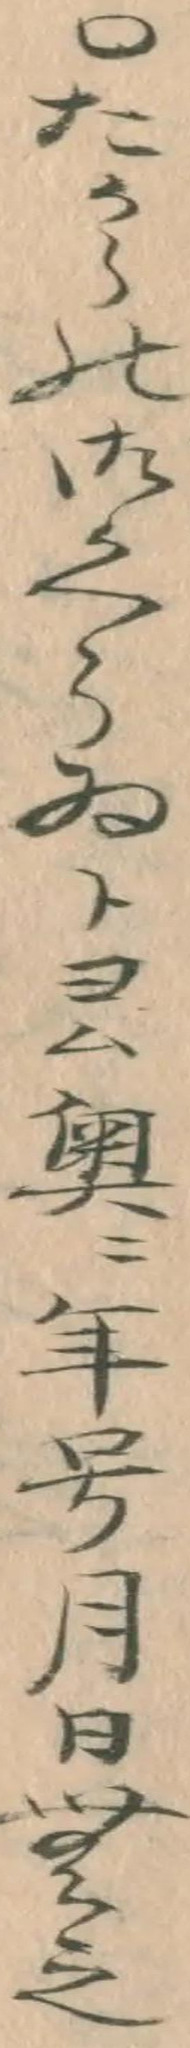〇たからの御くらゐトヨム奥ニ年号月日無之
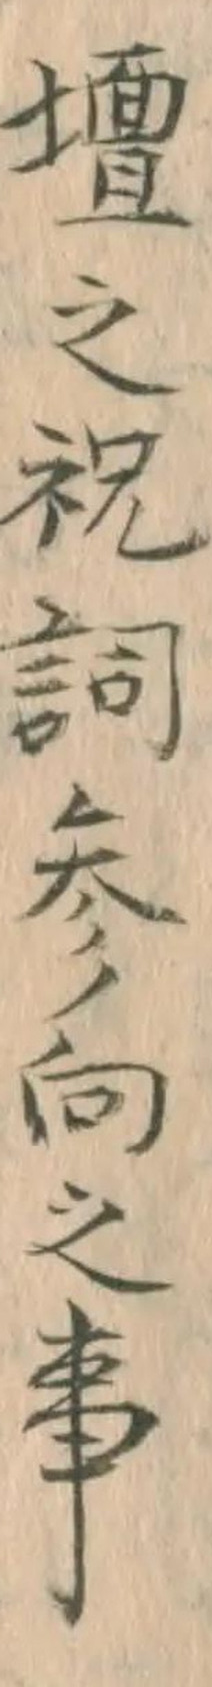壇之祝詞参向之事
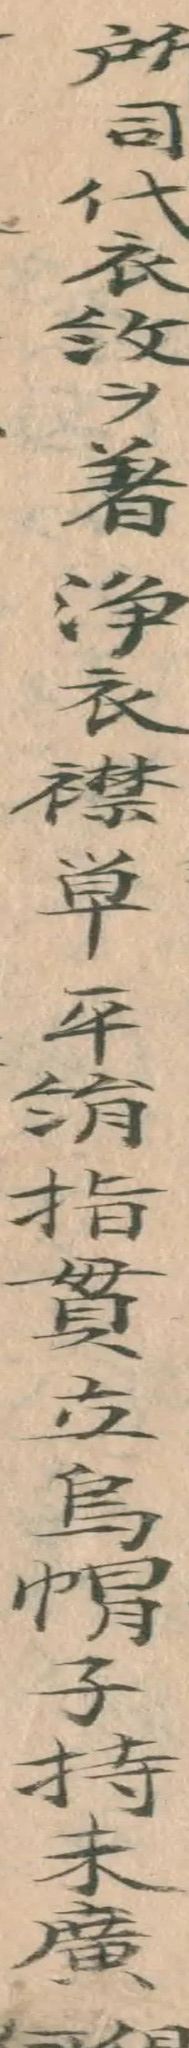所司代衣紋ヲ着浄衣襟単平絹指貫立烏帽子持未廣但何
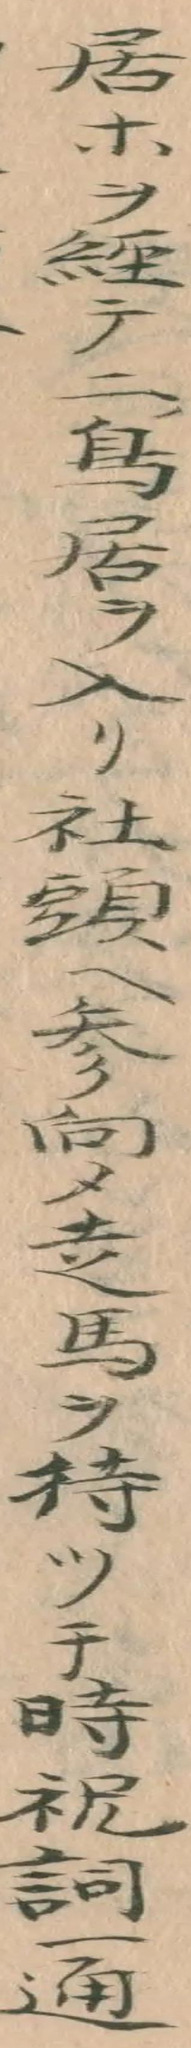居等ヲ経テ二鳥居ヲ入リ社頭へ参向〆走馬ヲ待ツ于時祝詞一通
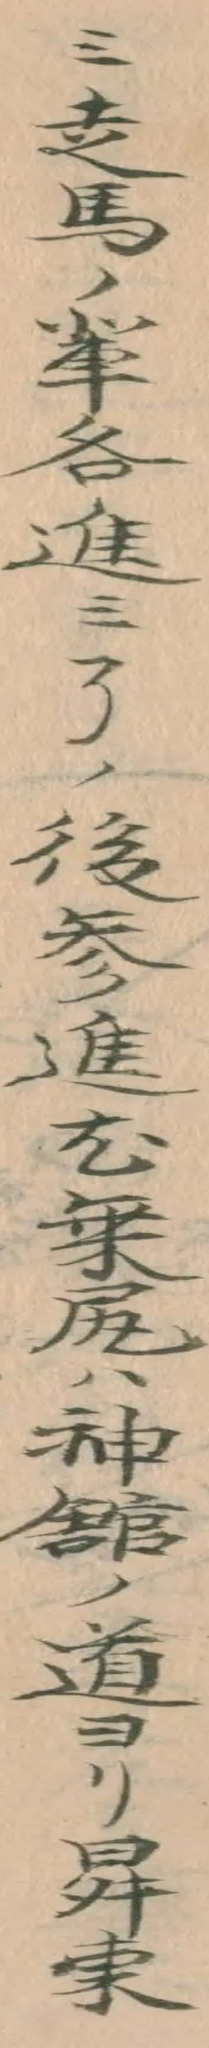ミ走馬ノ輩各進ミ了ノ後参進尤乗尻ハ神舘ノ道ヨリ昇東

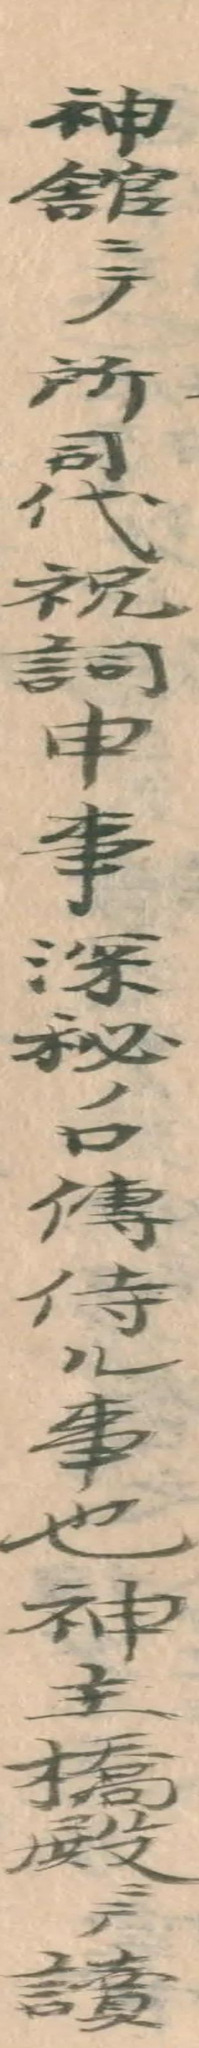一神館ニテ所司代祝詞申事深秘ノ口傳侍ル事也神主橋殿ニテ讀
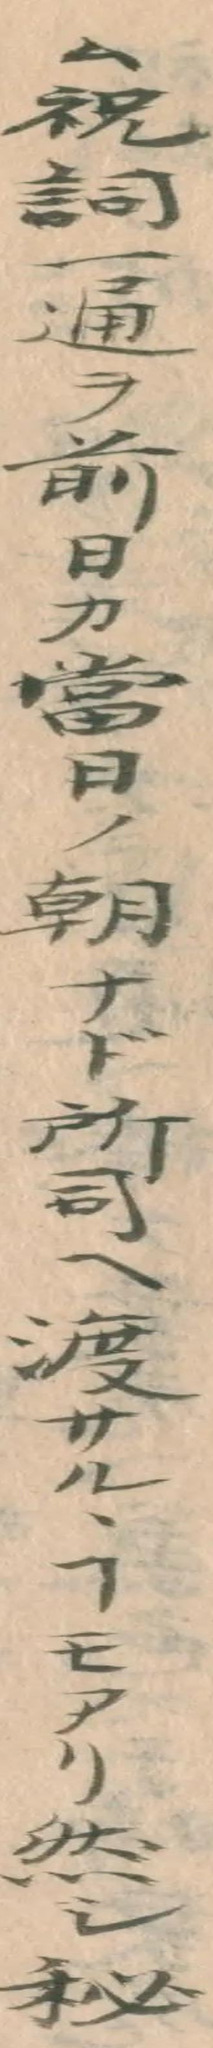ム祝詞一通ヲ前日カ當日ノ朝ナド所司ヘ渡サルヽヿモアリ然シ秘
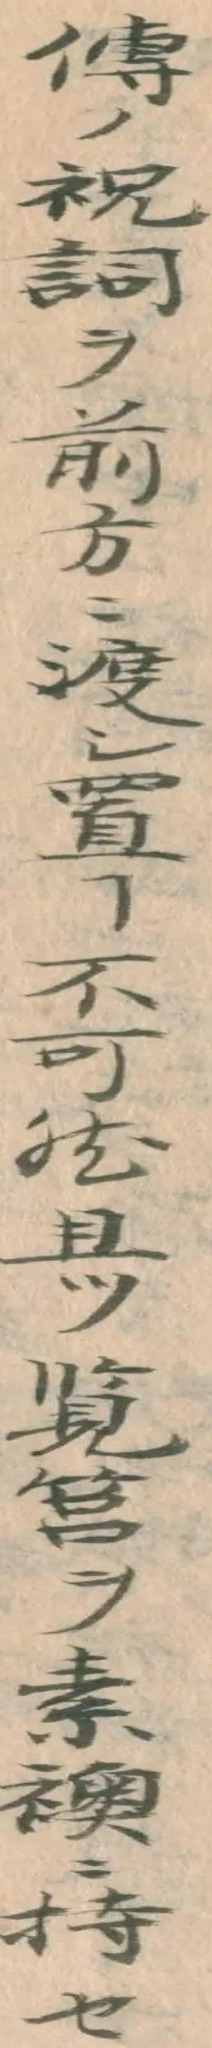傳ノ祝詞ヲ前方ニ渡シ置ヿ不可然且ツ覧筥ヲ素襖ニ持セ
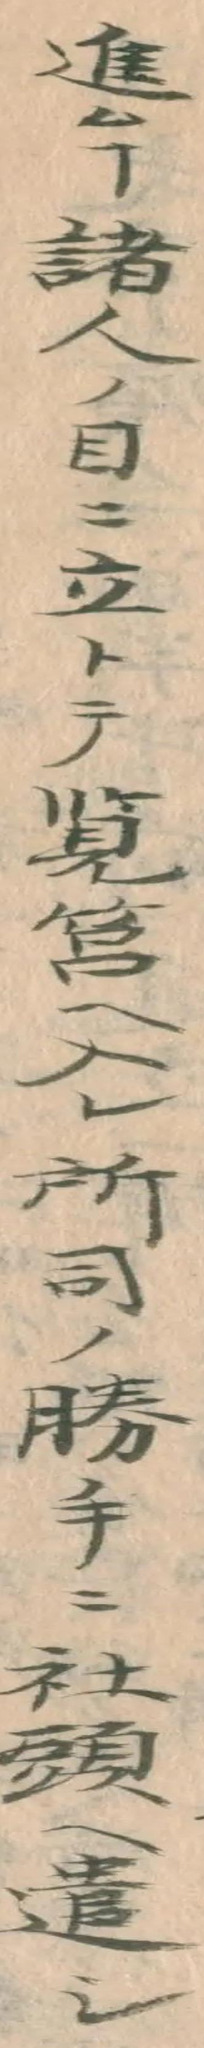進ムヿ諸人ノ目ニ立トテ覧筥ヘ入レ所司ノ勝手ニ社頭ヘ遣シ
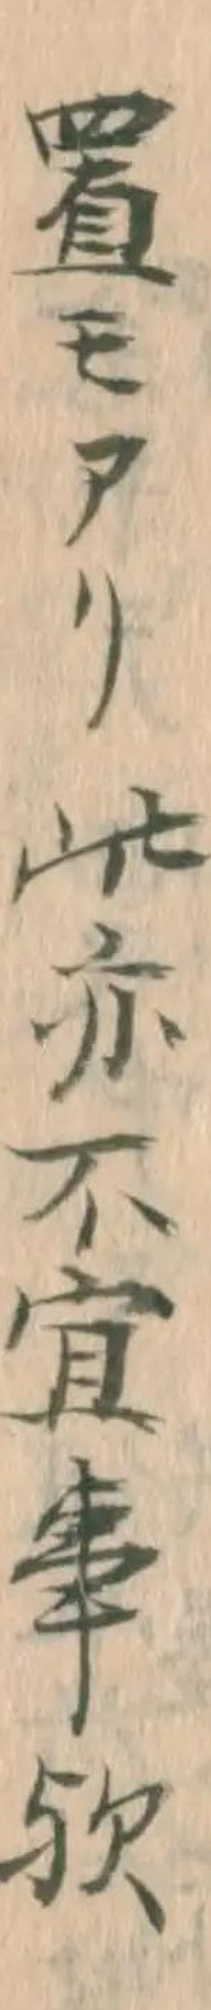置モアリ此亦不宜事歟
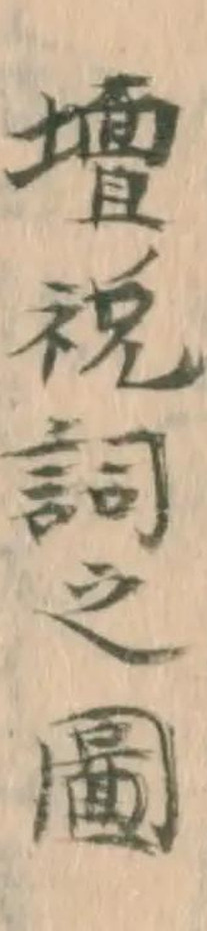壇ノ祝詞之図
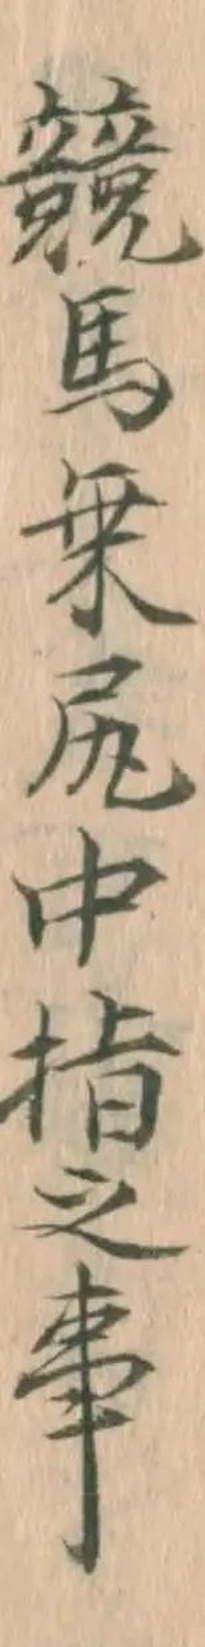競馬乗尻中指之事
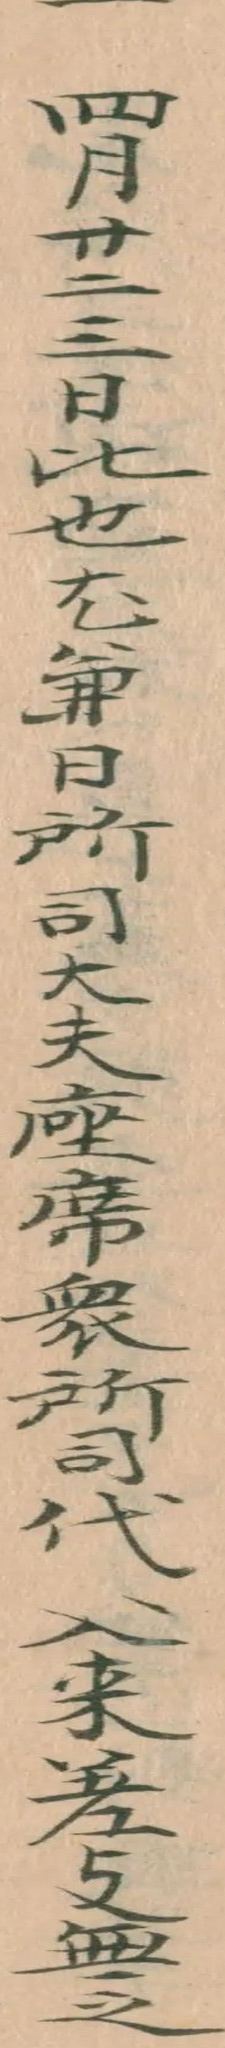一四月廿二三日比也尤兼日所司大夫座席衆所司代へ入来差支無之

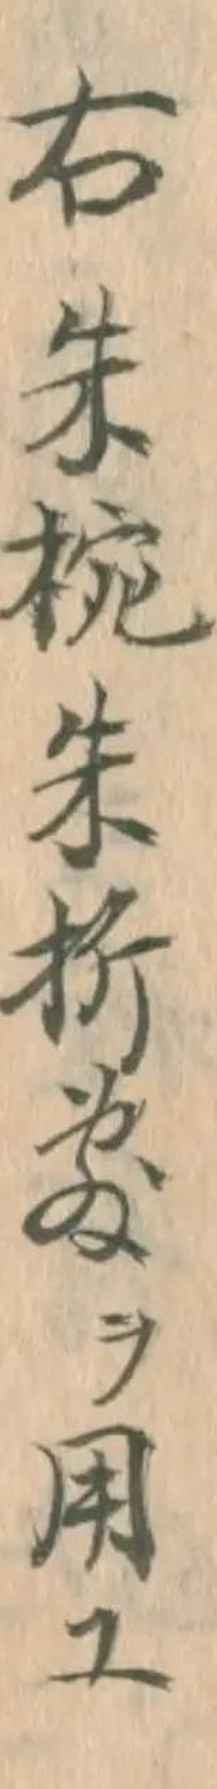右朱朱折敷ヲ用ユ
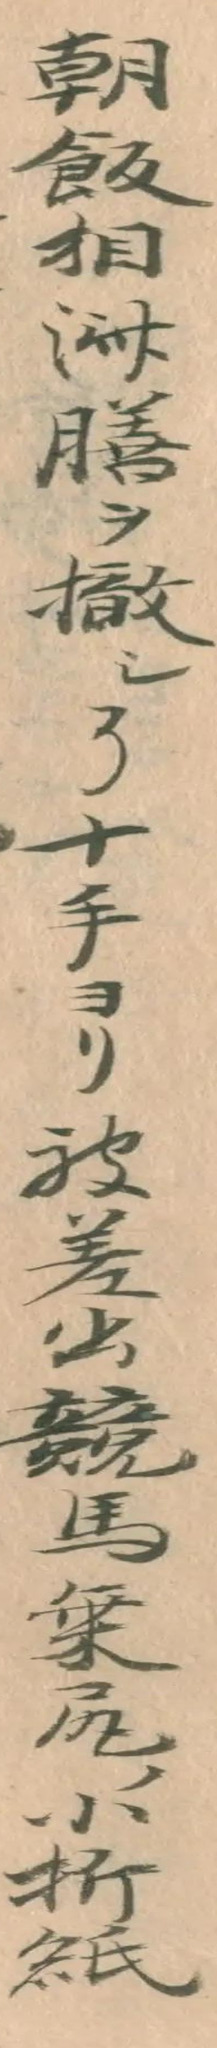朝飯相済膳ヲ撒シ了十手ヨリ被差出競馬乗尻ノ小折紙
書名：賀茂社記録. 第40冊
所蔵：国立国会図書館 National Diet Library, JAPAN
